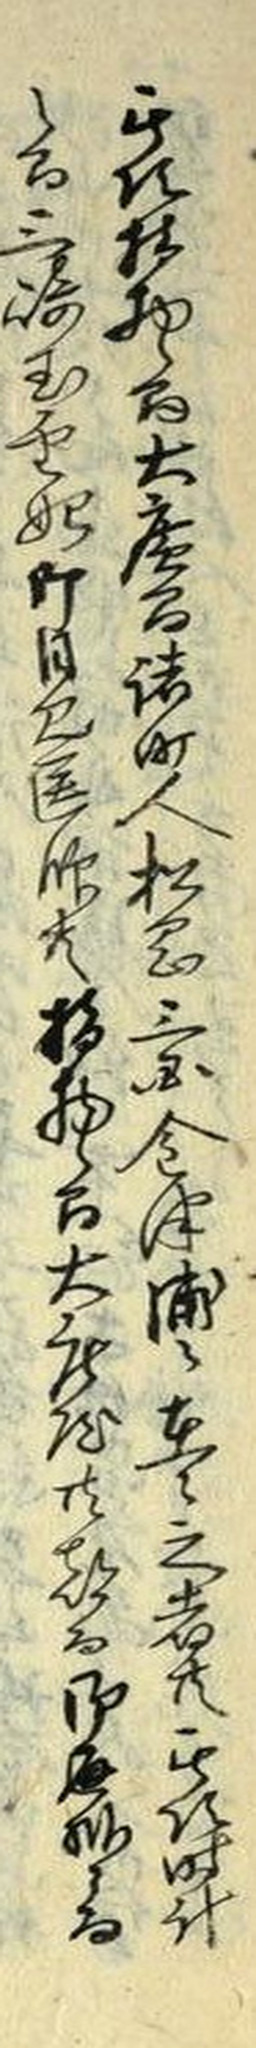之間三崎玉雲始御目見医師共指物之間大庄屋共都而御通掛ニ而
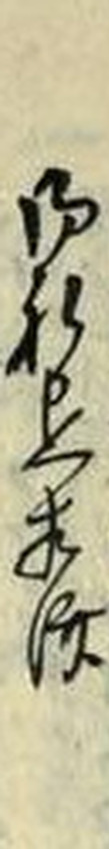御礼申上相済
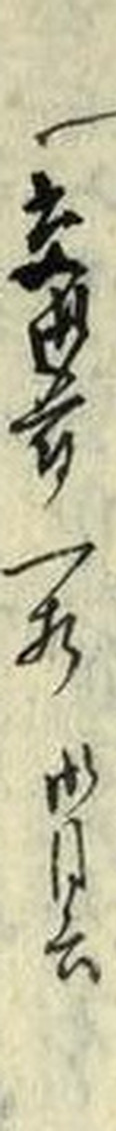交御肴一折御目六
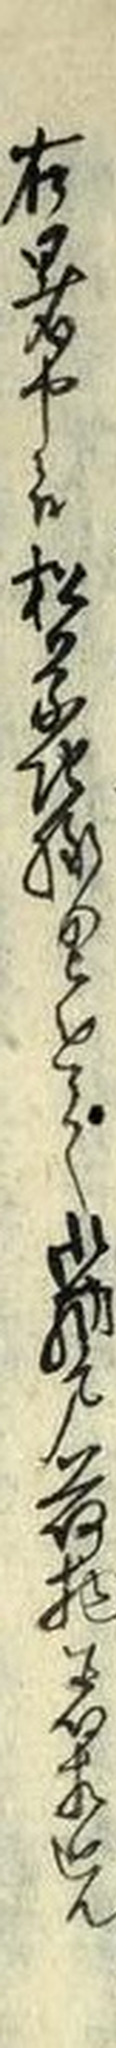右暑中ニ付松栄院様ゟ被進之御納戸荷物着相廻ㇽ
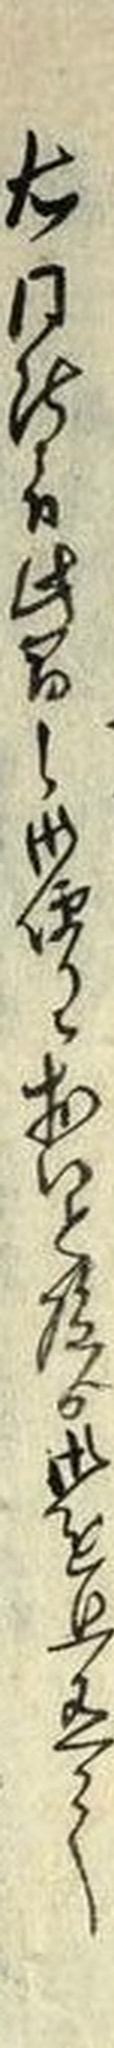右同断ニ付此間之御便りニおいと殿ゟ御進上有之
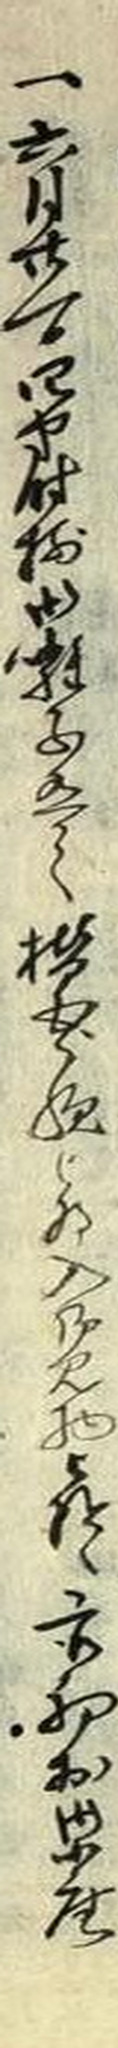一六月廿一日四半時揃御囃子有之楷五郎様被為入御見物被遊候最初於御小座
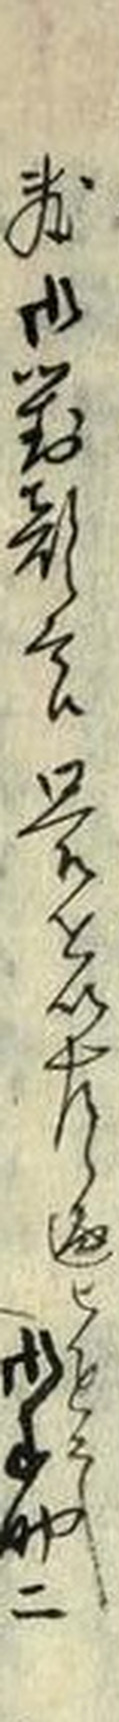敷御対顔之節思召を以左之通被進之
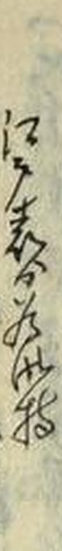江戸表ゟ為御持
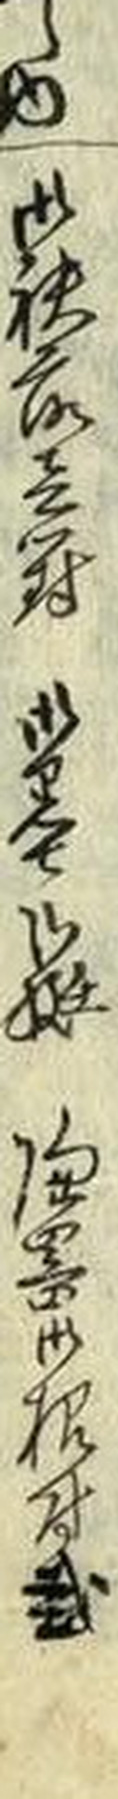御袂落壱対御墨弐挺陶器御根付弐
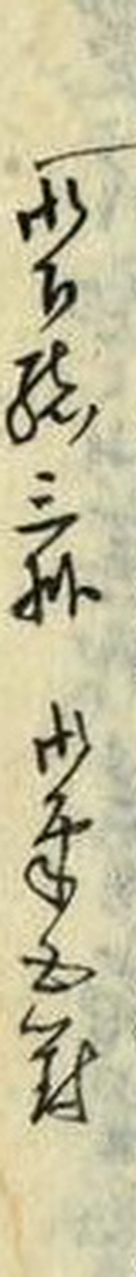御下緒三掛御筆五対

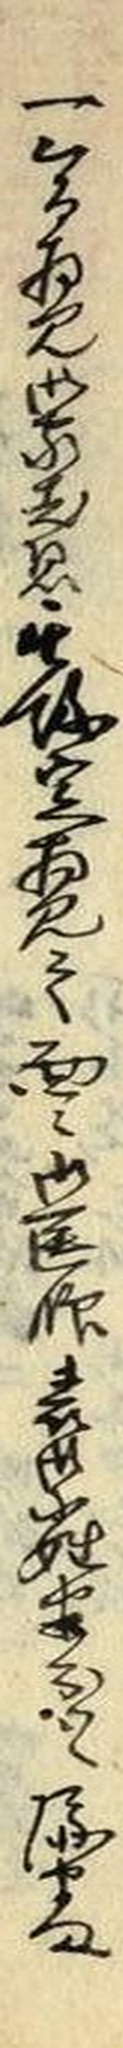一今日拝見御家老息其余定拝見之面々御医師表御小姓半分ツヽ隔番
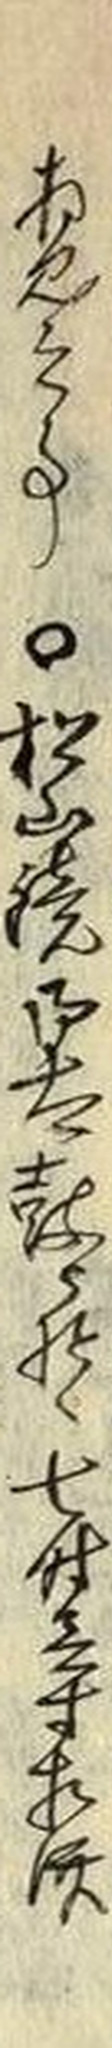拝見之事〇松山鏡御太鼓被遊候七時壱寸相済
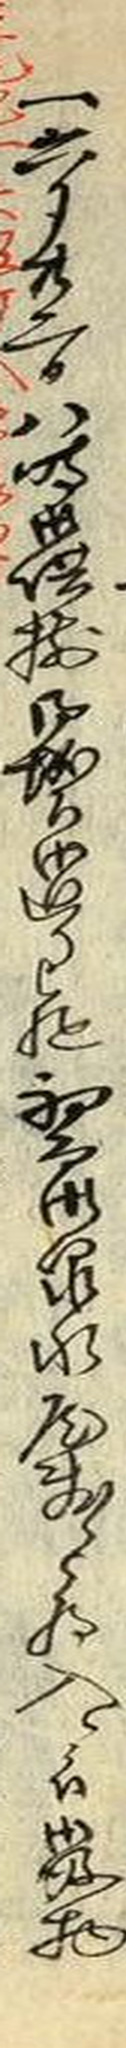一六月廿二日八時御供揃御城下御廻り被遊初而御泉水屋敷へ被為入候ニ付御吸物
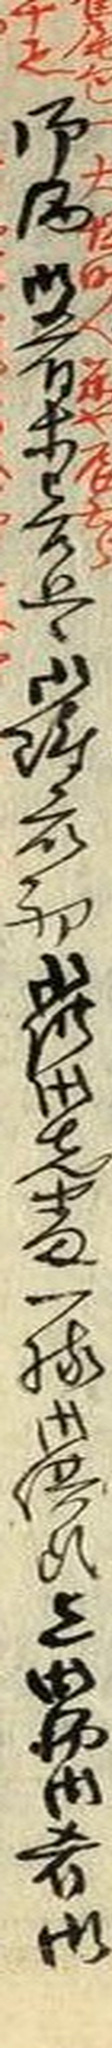御酒御肴等被召上候御附衆初御供御先番一統御供頭迄御酒御肴御
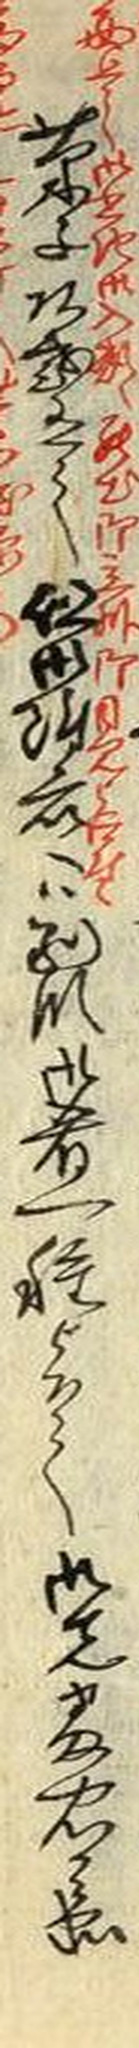菓子頂戴有之但御附へハ別段御肴一種被下之御先番忠兵衛
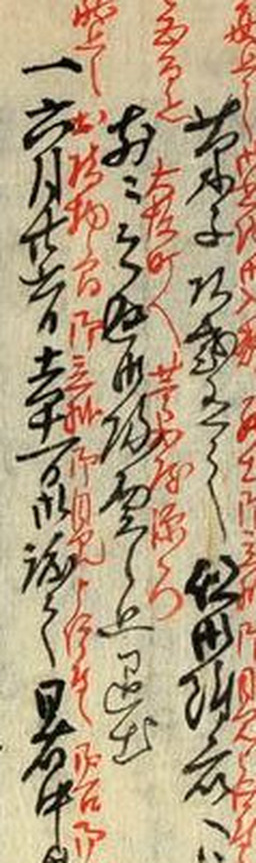前々之通御帰殿之上退出
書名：少傅日録抄（斉善付側向頭取日記、江戸并道中、初入在国、逝去後…
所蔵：福井県文書館 Fukui Prefectural Archives
